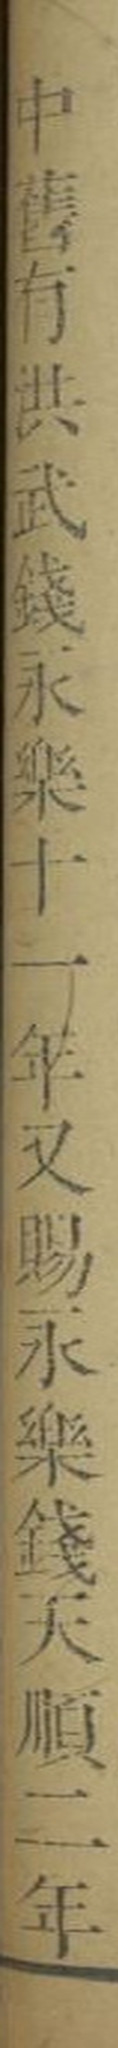中旧有洪武銭永楽十一年又賜永楽銭天順二年
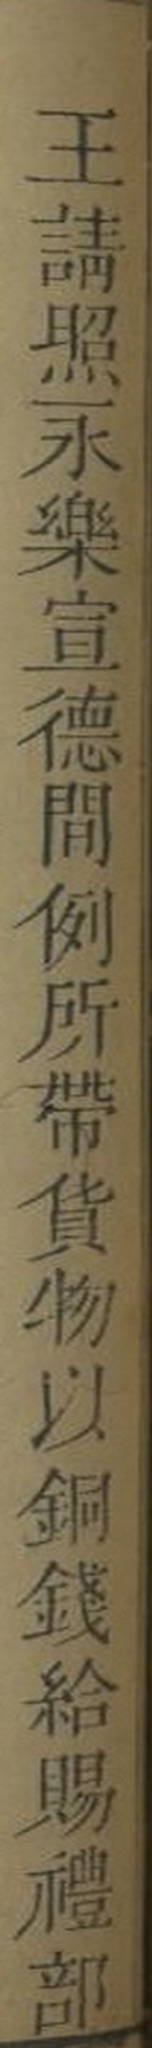王請照永楽宣徳間例所帯貨物以銅銭給賜礼部
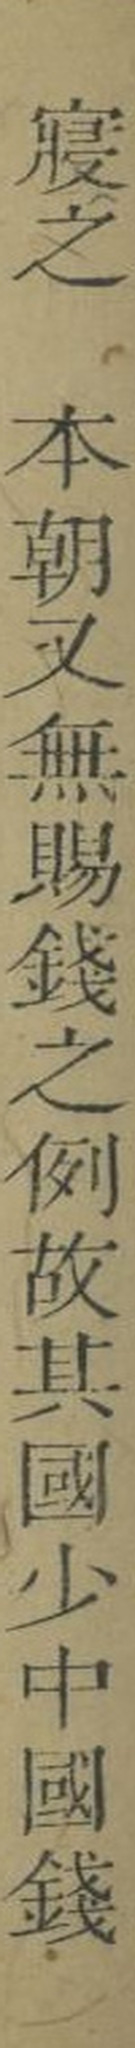寝之本朝又無賜銭之例故其国少中国銭
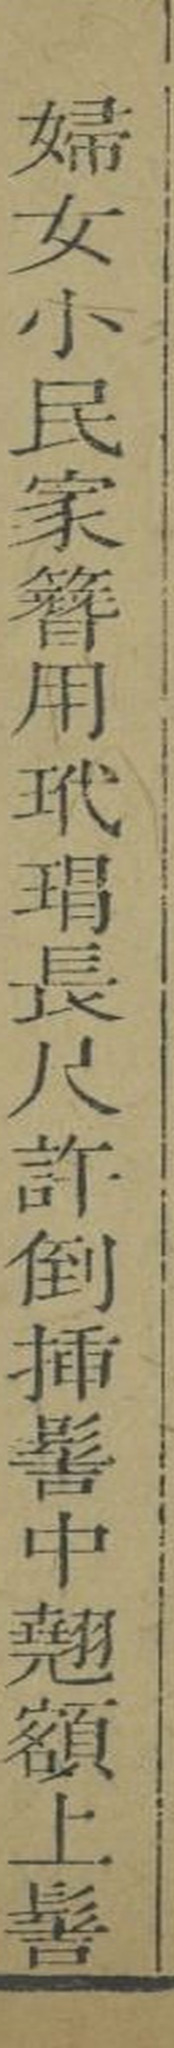婦女小民家簪用玳瑁長尺許倒揷髻中翹額上髻
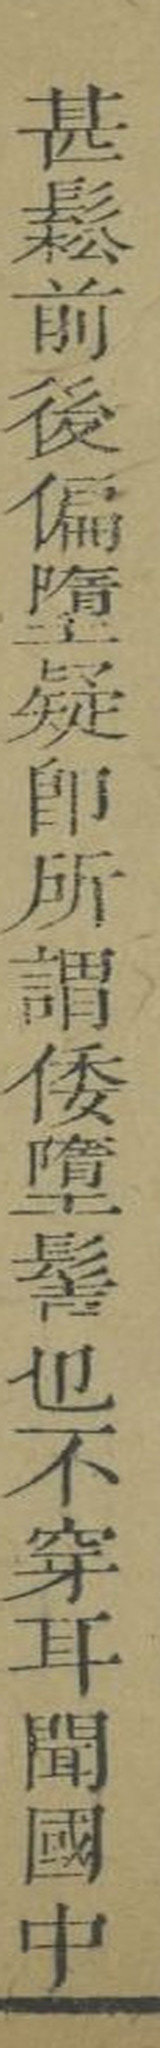甚鬆前後偏堕疑即所謂倭堕髻也不穿耳聞国中
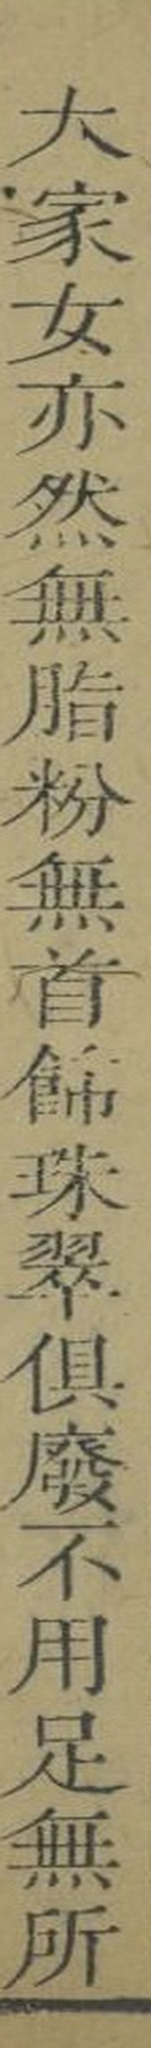大家女亦然無脂粉無首飾珠翠倶廃不用足無所
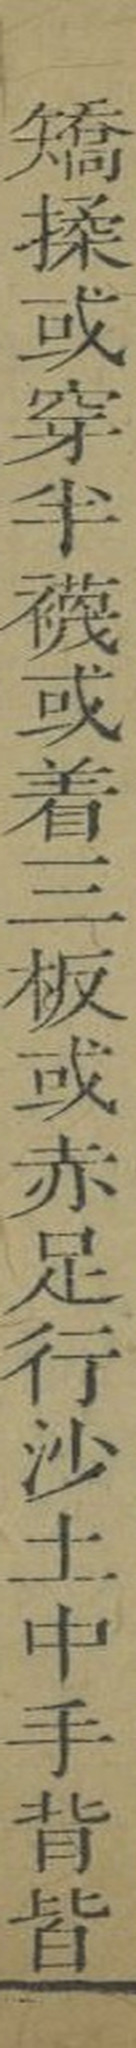矯揉或穿半襪或着三板或赤足行沙土中手背皆
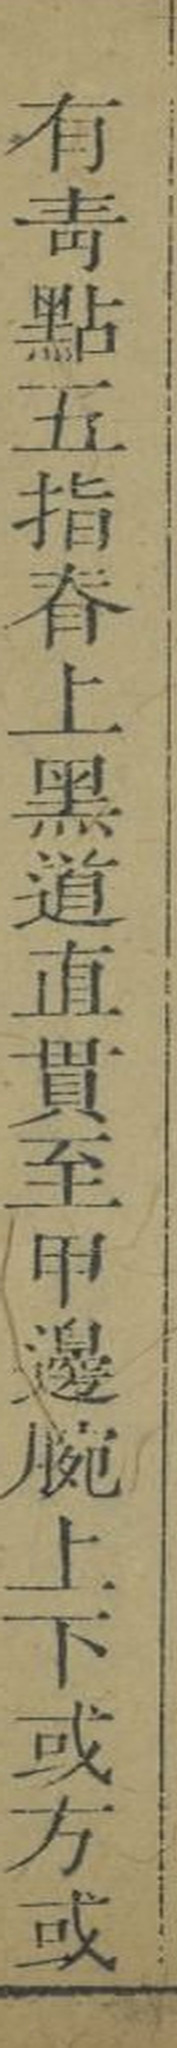有青点五指脊上黒道直貫至甲辺腕上下或方或
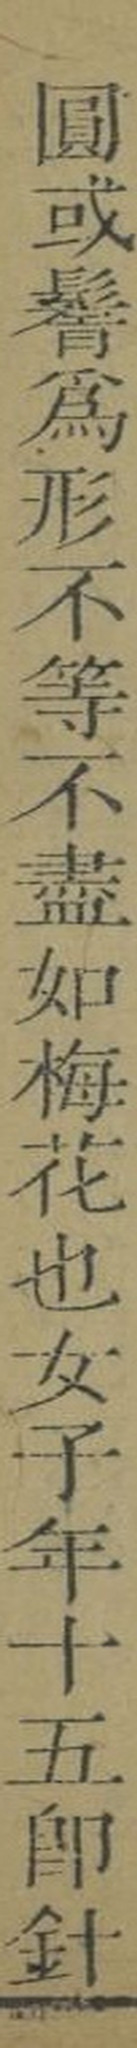円或鬌為形不等不尽如梅花也女子年十五即針
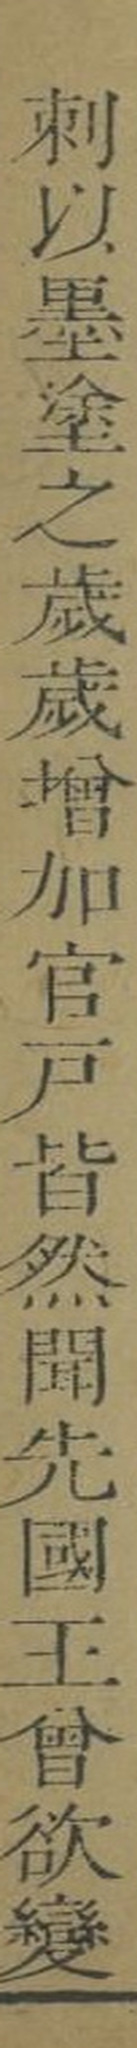刺以墨塗之歳歳増加官戸皆然聞先国王曽欲変

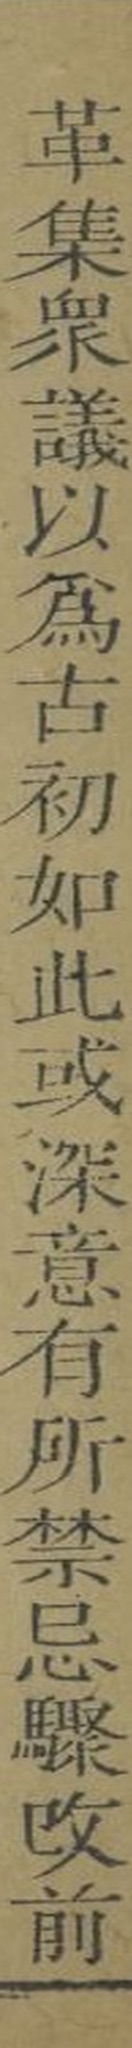革集衆議以為古初如此或深意有所禁忌驟改前
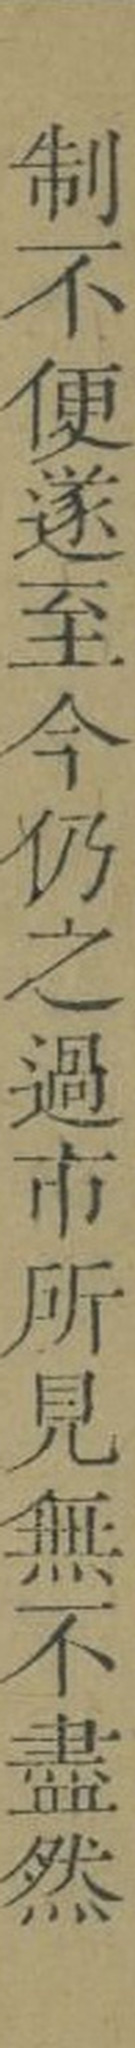制不便遂至今仍之過市所見無不尽然
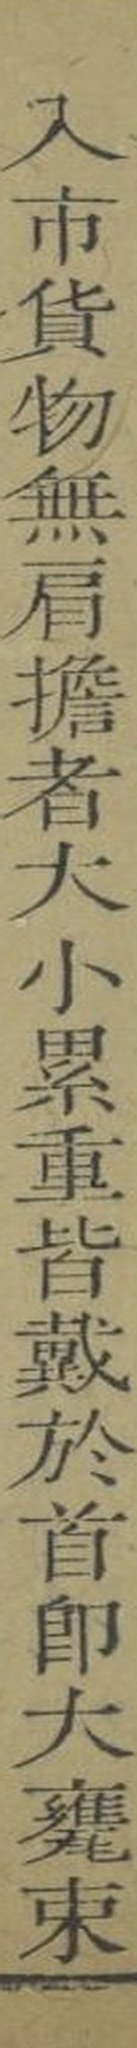入市貨物無肩担者大小累重皆戴於首即大甕束
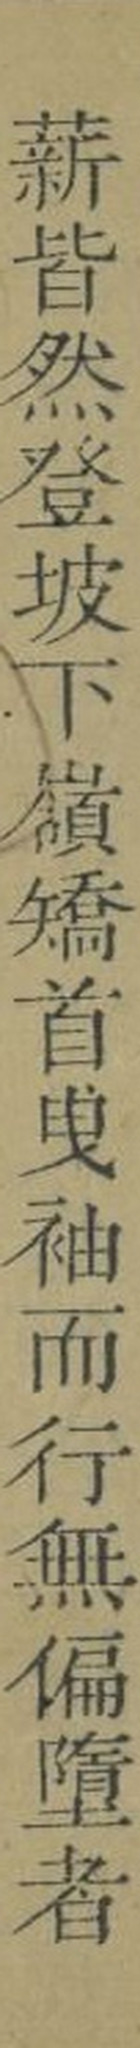薪皆然登坡下嶺矯首曳袖而行無偏墮者
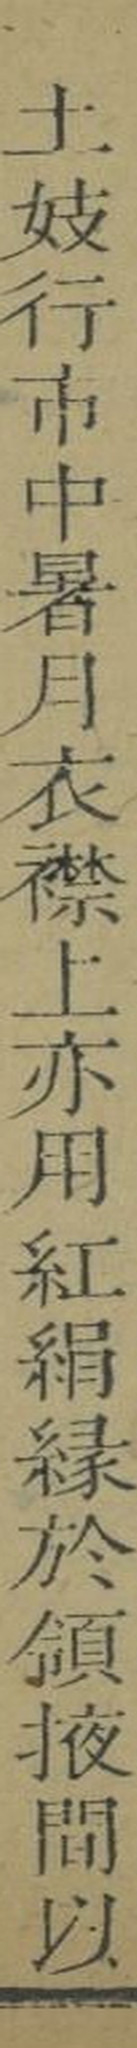土妓行市中暑月衣襟上亦用紅絹縁於領掖間以
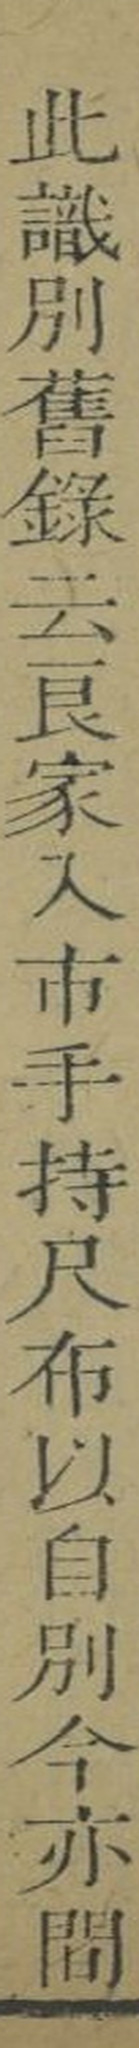此識別旧録云良家入市手持尺布以自別今亦間
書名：中山伝信録 巻六
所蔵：University of the Ryukyus Library
